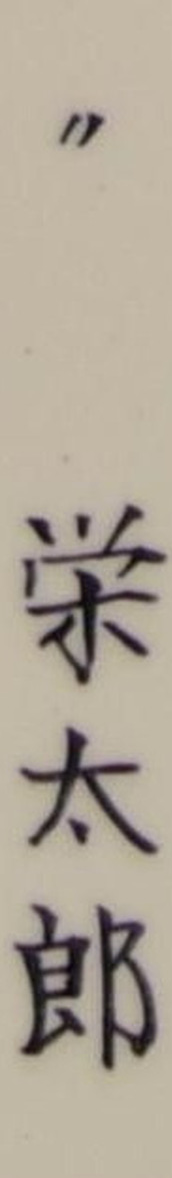栄太郎
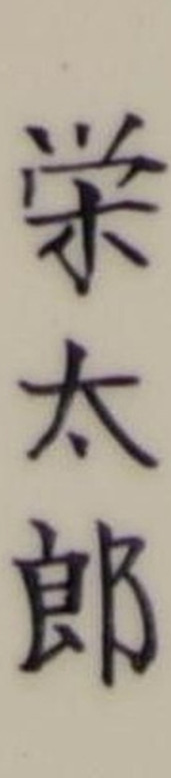栄太郎
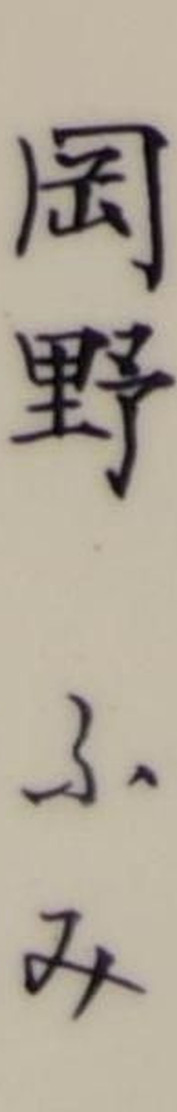岡野ふみ
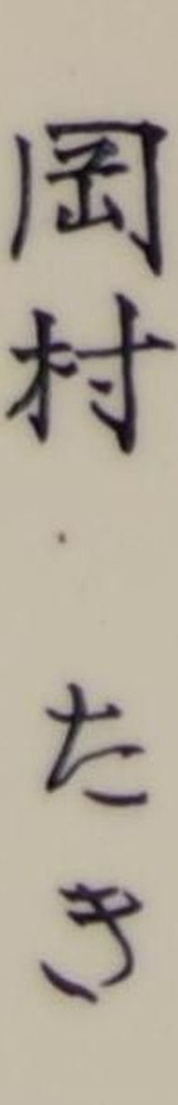岡村たき
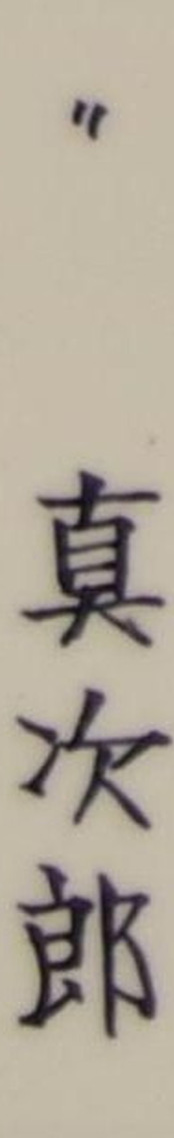真次郎
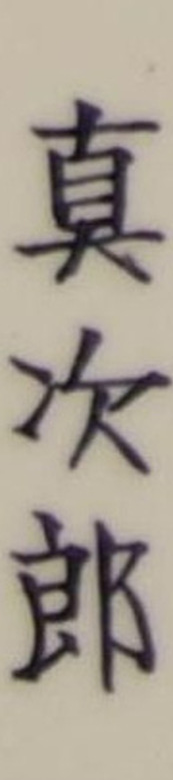真次郎

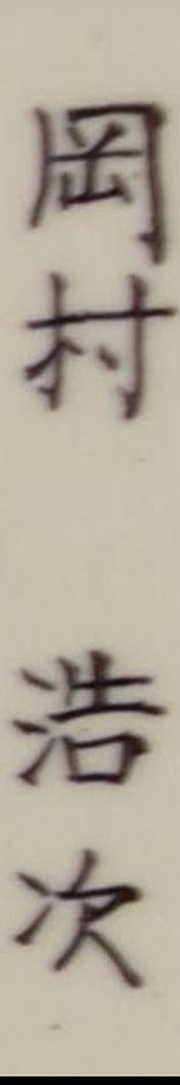岡村浩次
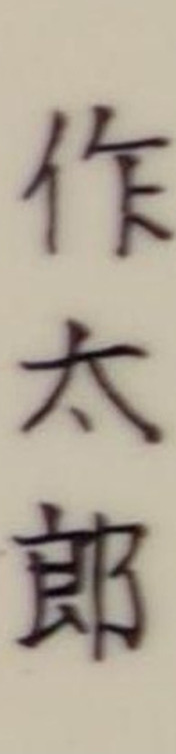作太郎
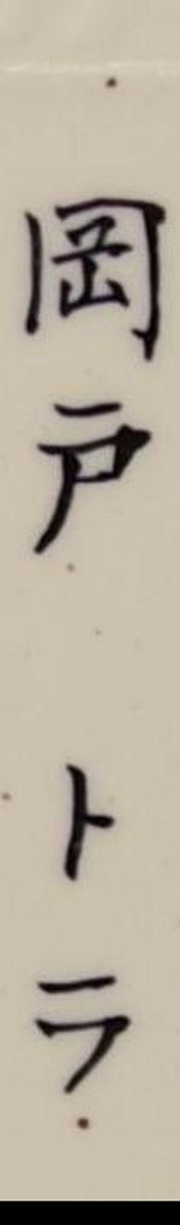岡戸トラ
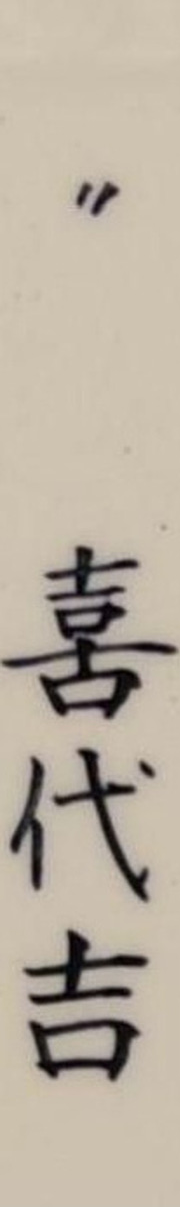喜代吉
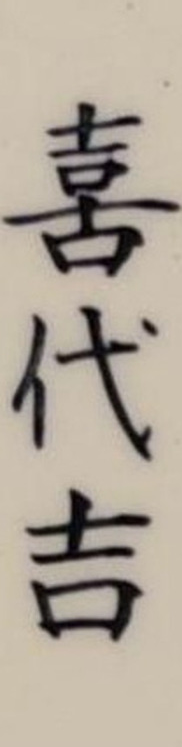喜代吉
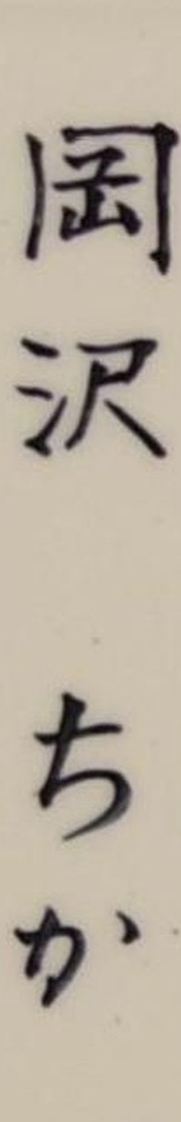岡沢ちか
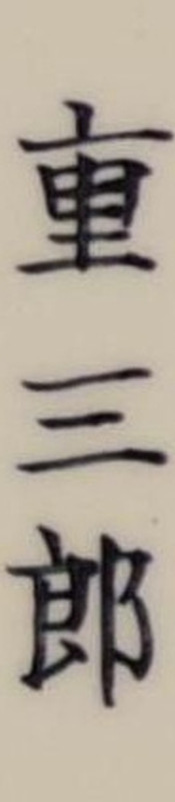重三郎
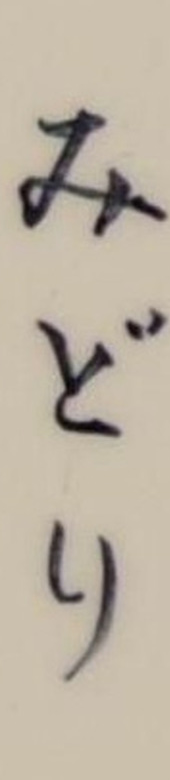みどり
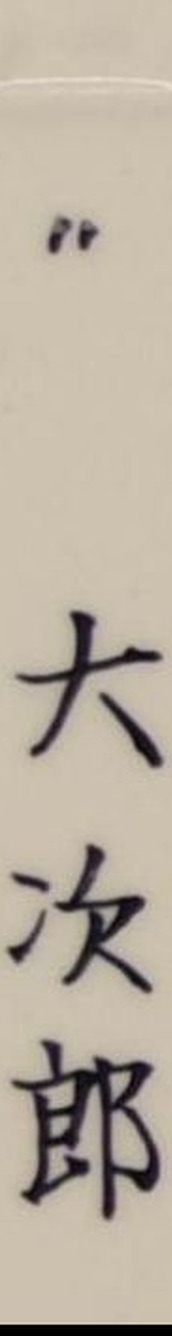大次郎
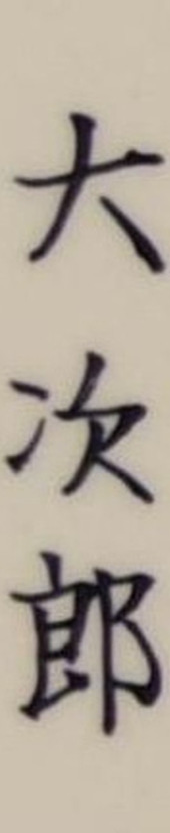大次郎
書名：E~L
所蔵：高野山金剛峯寺
